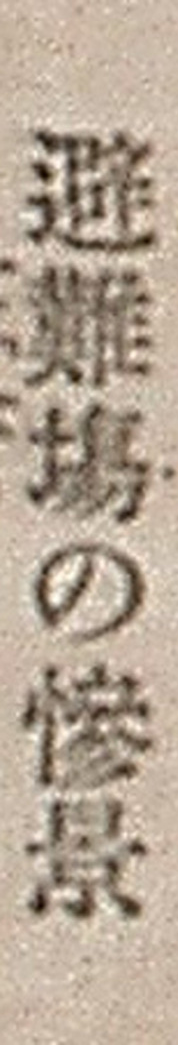避難場の惨景
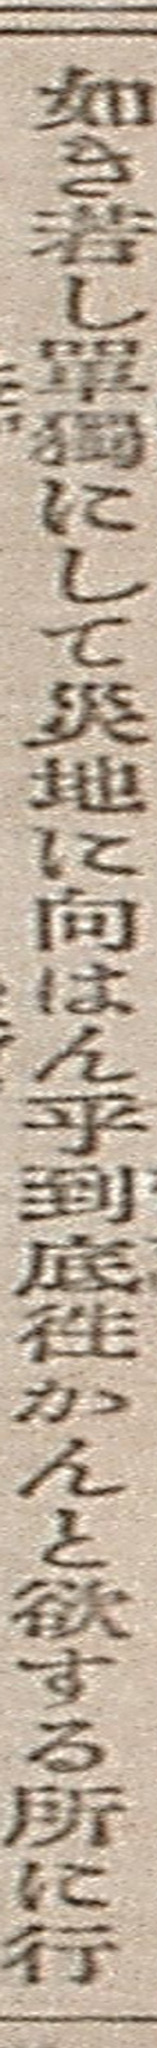如き若し単独にして災地に向はん乎到底往かんと欲する所に行
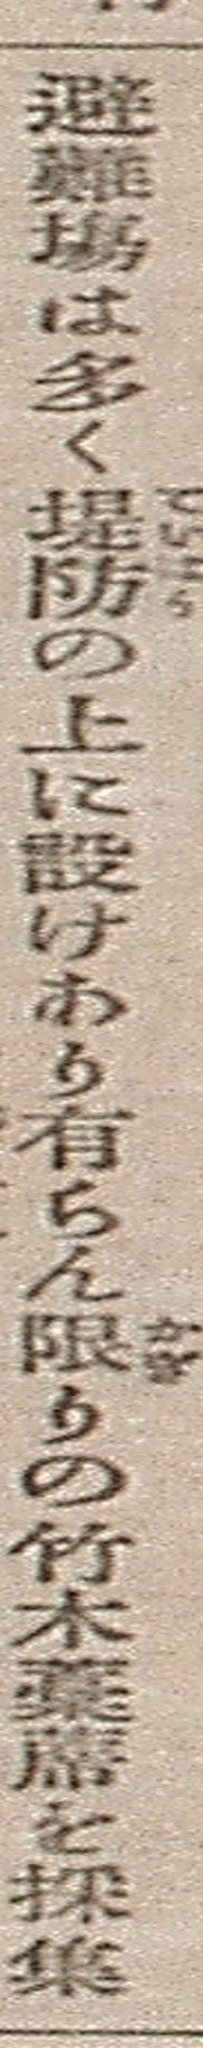避難場は多く堤防の上に設けあり有らん限りの竹木藁蓆を採集
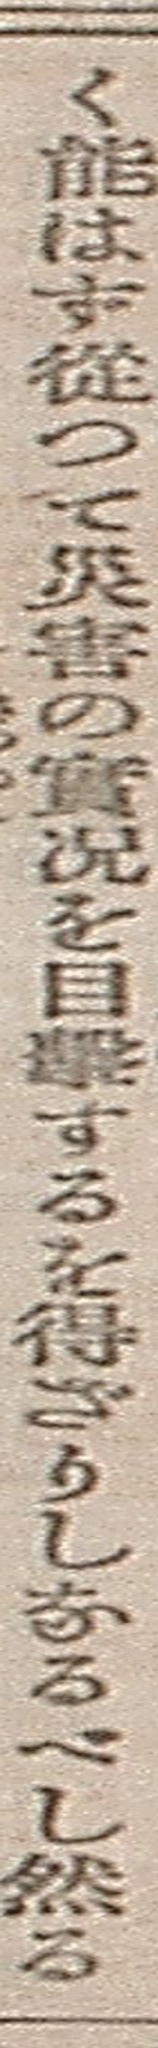く能はず従つて災害の実況を目撃するを得ざりしなるべし然る
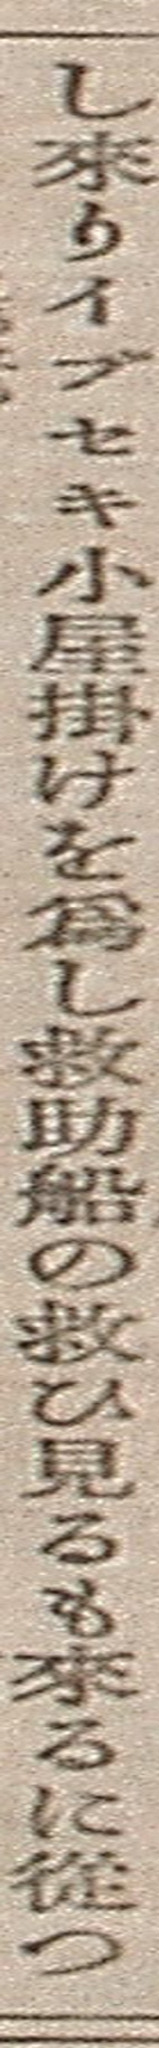し来りイブセキ小屋掛けを為し救助船の救ひ見るも来るに従つ
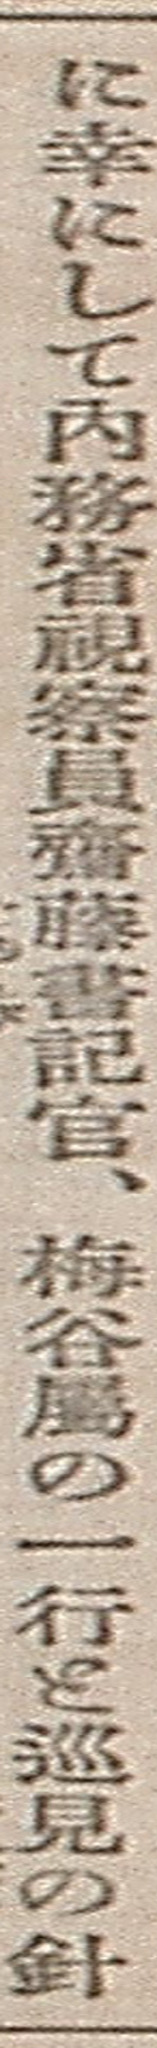に幸にして内務省視察員斉藤書記官、梅谷属の一行と巡見の針
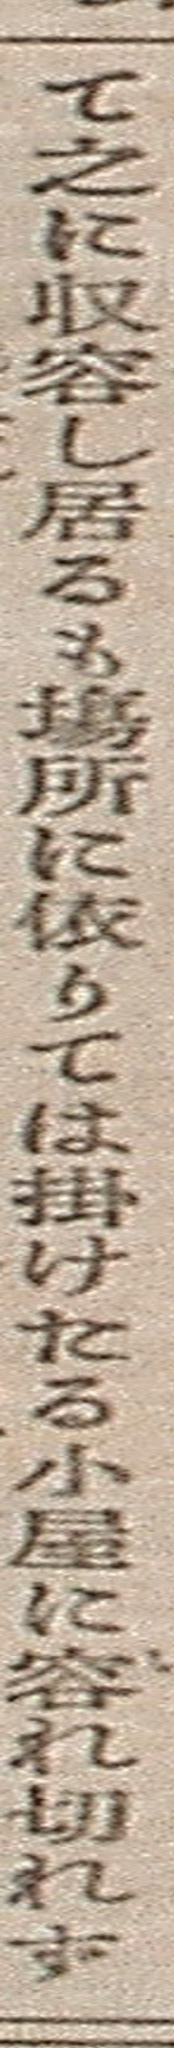て之に収容し居るも場所に依りては掛けたる小屋に容れ切れず
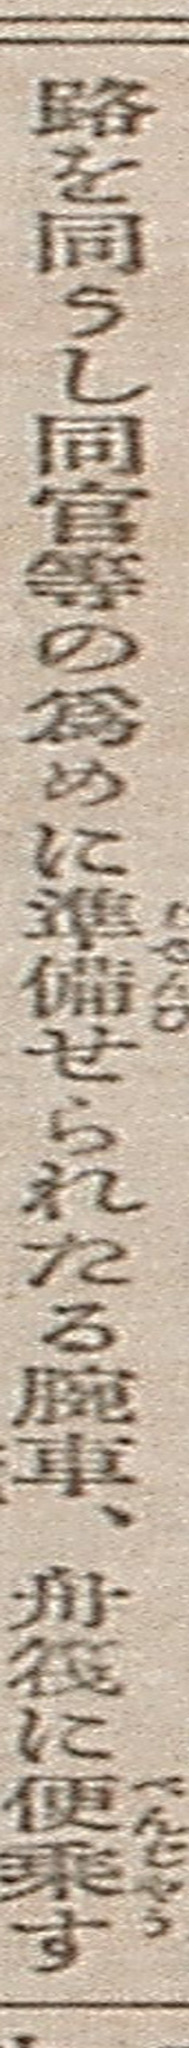路を同うし同官等の為めに準備せられたる腕車、舟筏に便乗す
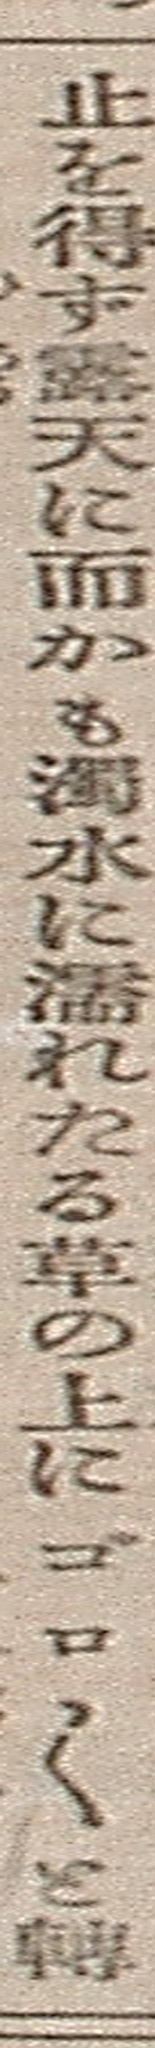止を得ず露天に而かも濁水に濡れたる草の上にゴロ〳〵と転
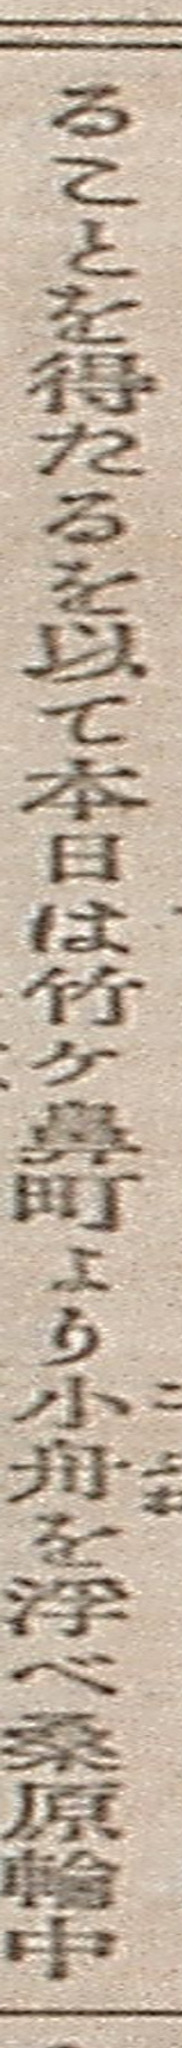ることを得たるを以て本日は竹ヶ鼻町より小舟を浮べ桑原輪中
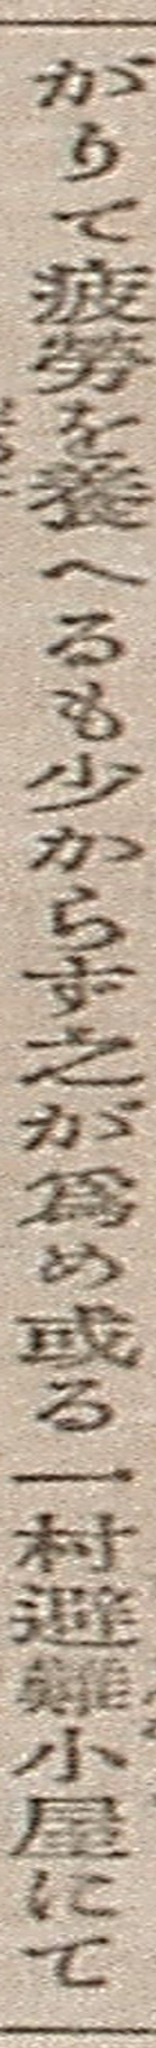がりて疲労を養へるも少からず之が為め或る一村避難小屋にて
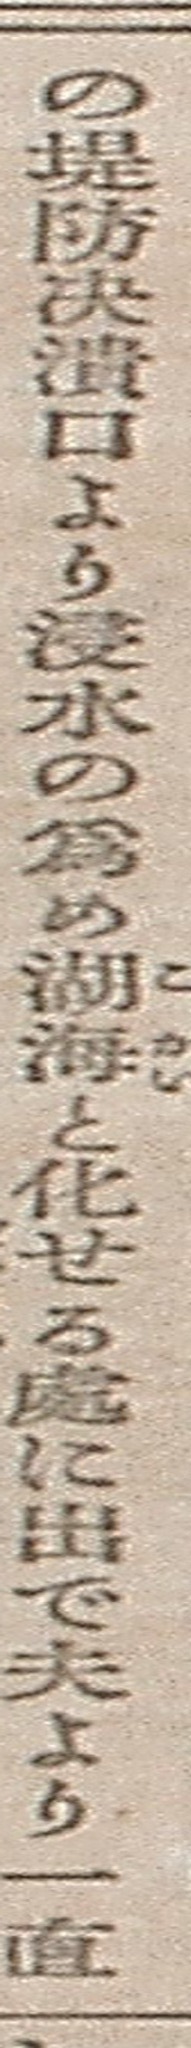の堤防決潰口より浸水の為め湖海と化せる処に出で夫より一直
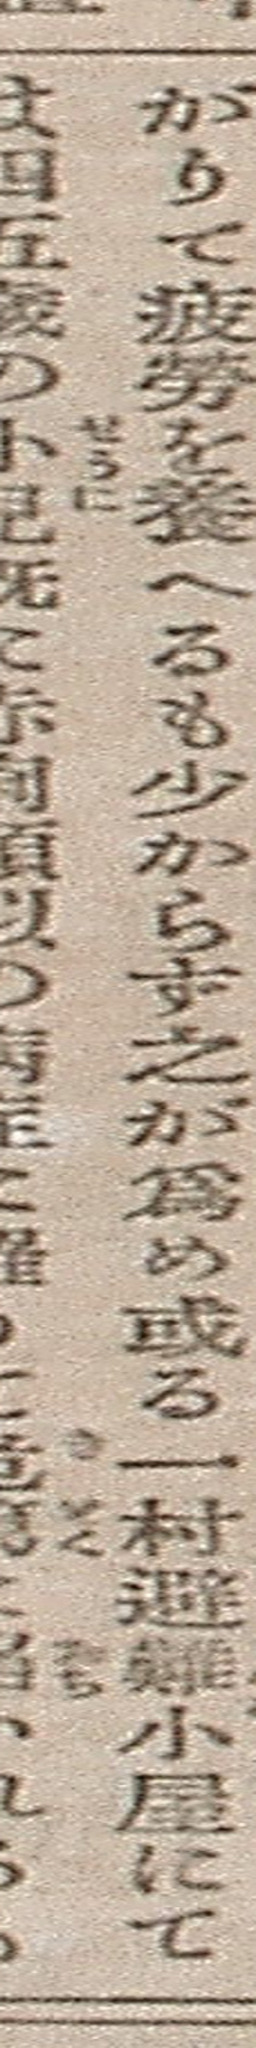は四五歳の小兒既に赤痢類似の病症に罹りて危篤に陥いれるも
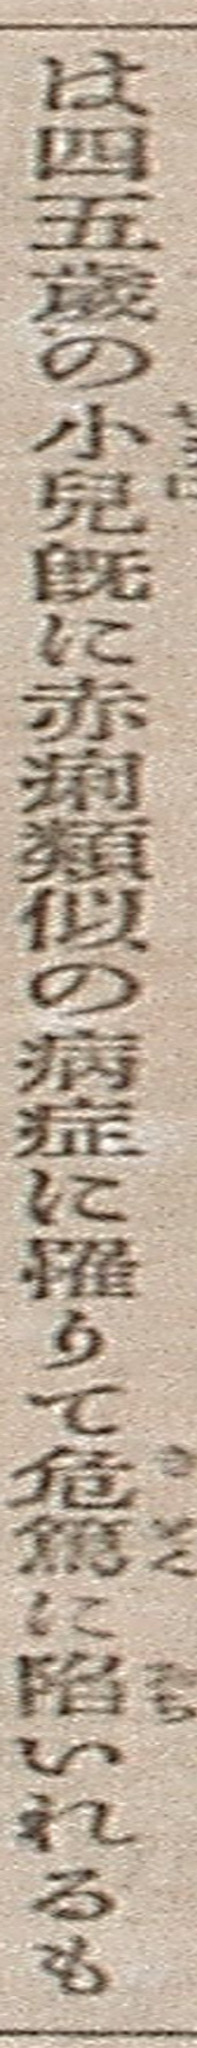は四五歳の小兒既に赤痢類似の病症に罹りて危篤に陥いれるも
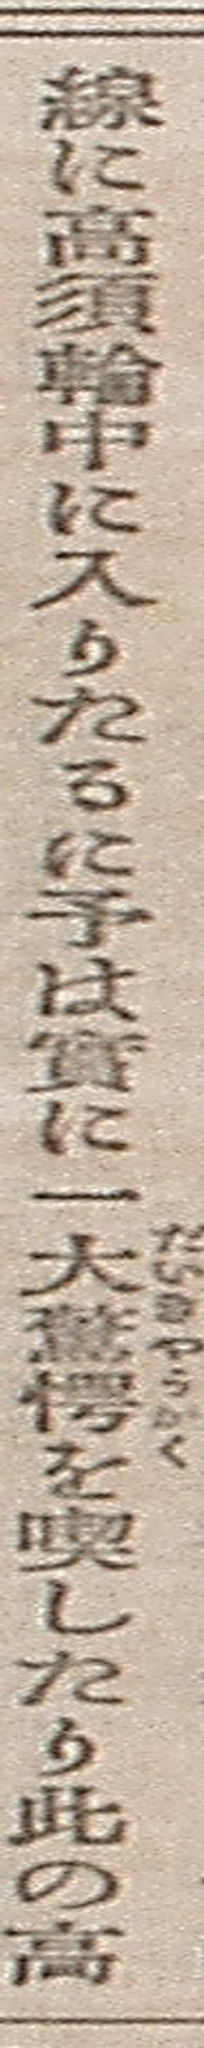線に高須輪中に入りたるに予は実に一大驚愕を喫したり此の高
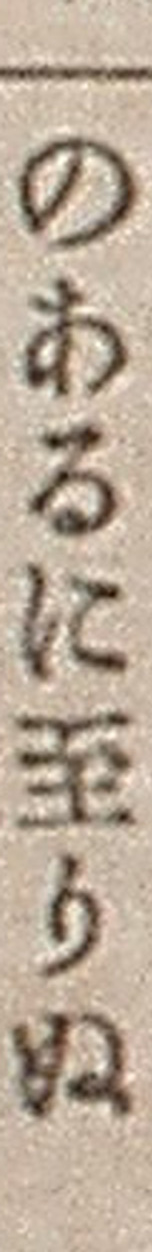のあるに至りぬ
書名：風俗畫報臨時増刊第百二十六號　洪水被害録（中）
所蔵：東京大学地震研究所図書室 Earthquake Research Institute Library, The University of Tokyo, JAPAN
